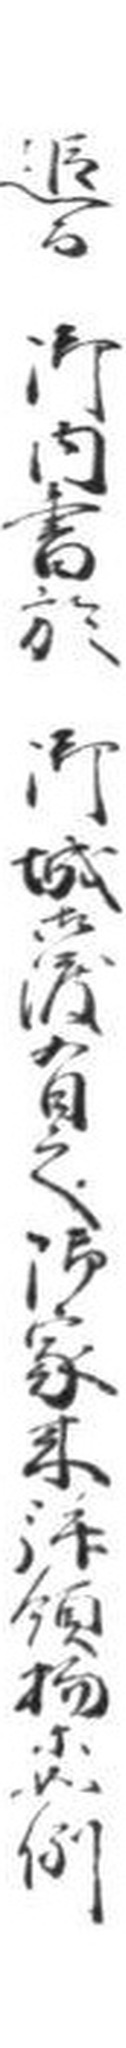追而御内書於御城御渡有之御家来拝領物等如例
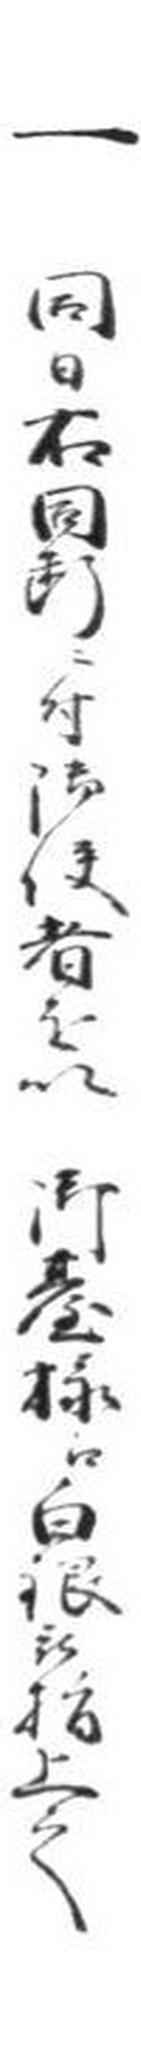一同日右同断ニ付御使者を以御台様江白銀被指上之
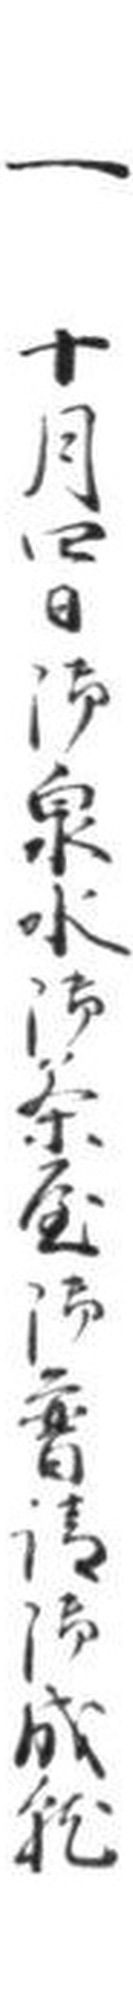一十月四日御泉水御茶屋御普請御成就
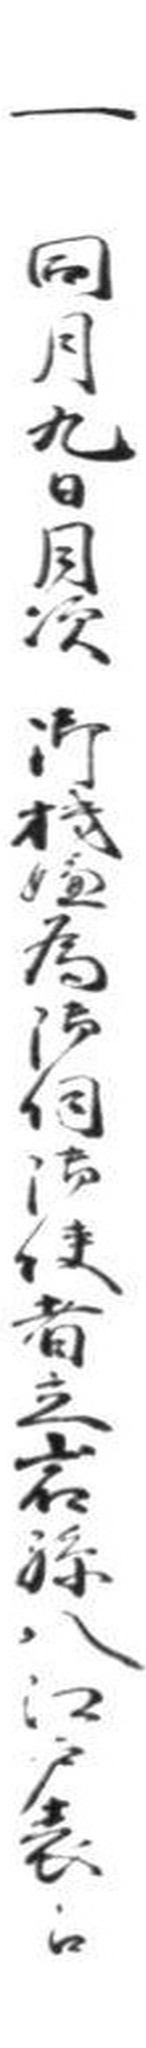一同月九日月次御機嫌為御伺御使者立岩孫八江戸表江
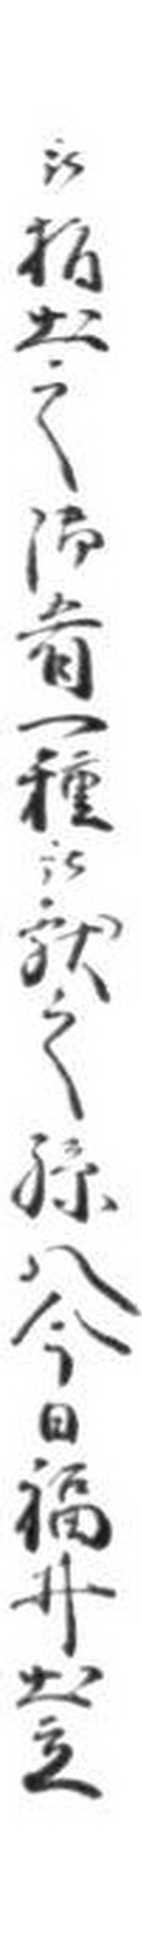被指出之御肴一種被献之孫八今日福井出立
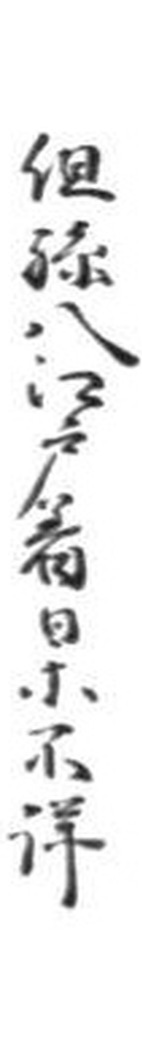但孫八江戸着日等不詳
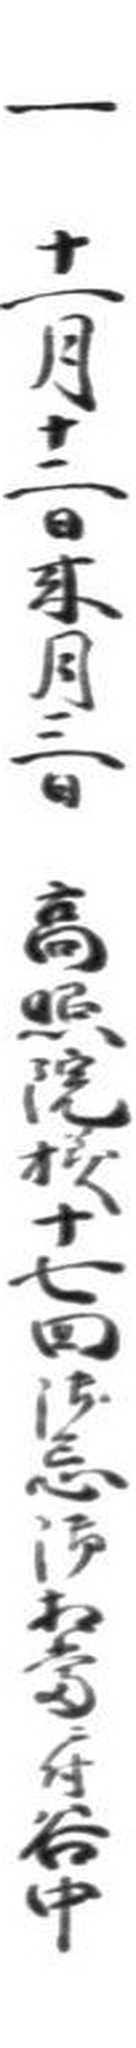一十一月十二日来月三日高照院様十七回御忌御相当ニ付谷中
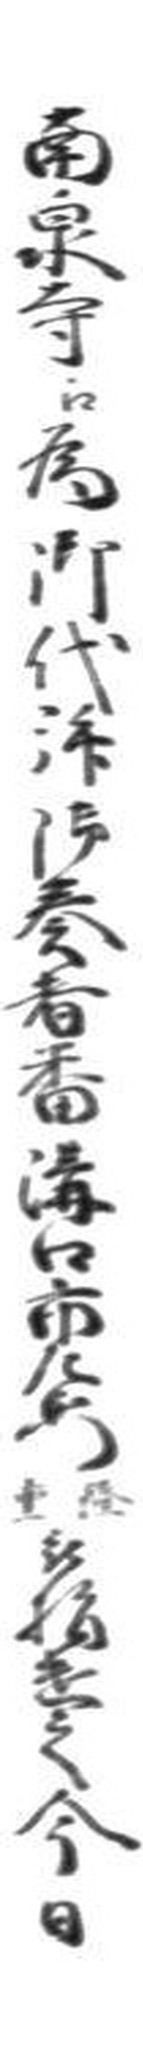南泉寺江為御代拝御奏者番溝口市左衛門隆重被指遣之今日
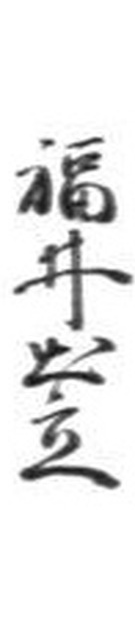福井出立
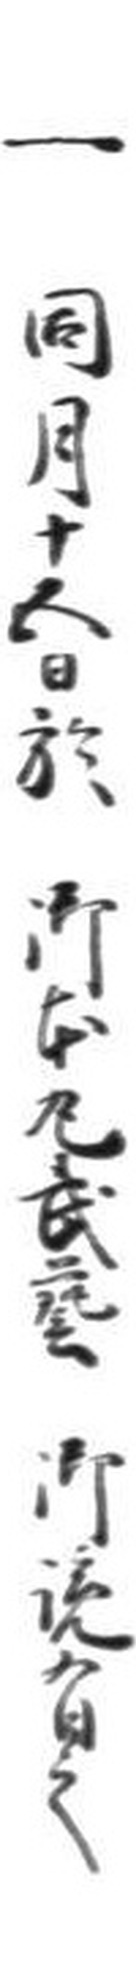一同月十五日於御本丸武芸御覧有之
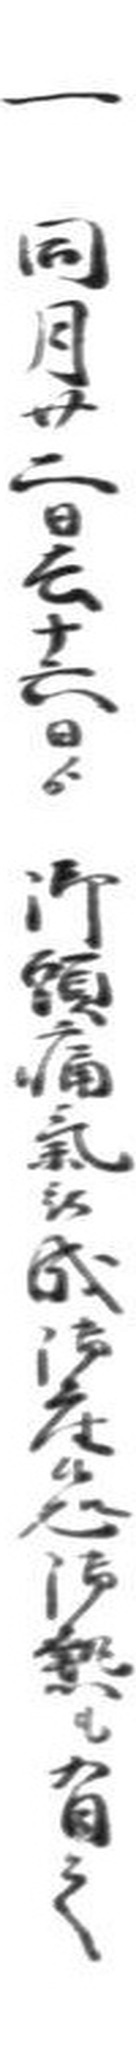一同月廿二日去十六日ゟ御頭痛気被成御座候処御熱も有之
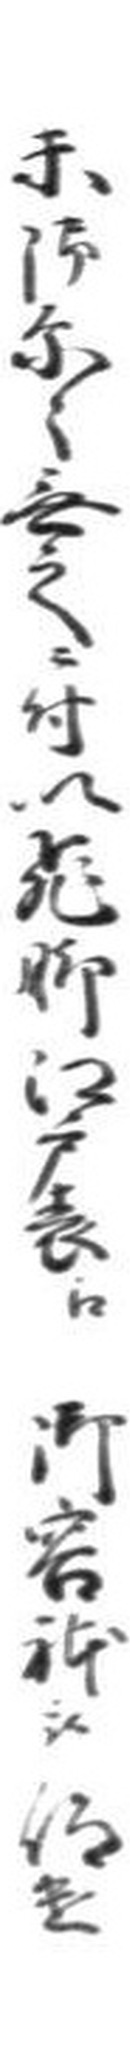未御爾々無之二付以飛脚江戸表江御容体被仰遣

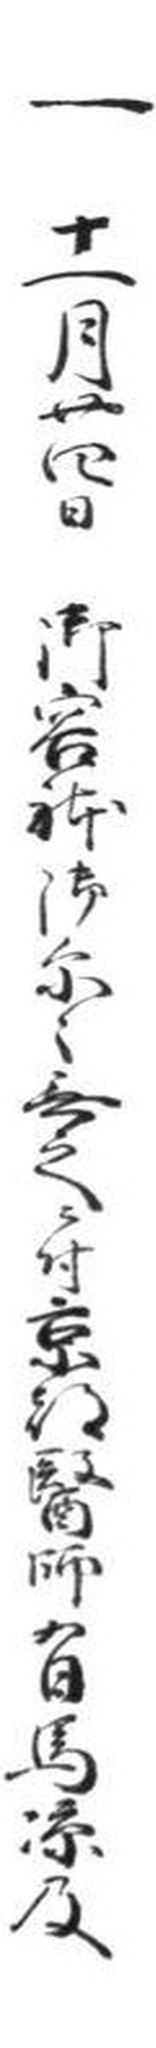一十一月廿四日御容体御爾々無之二付京都医師有馬涼及
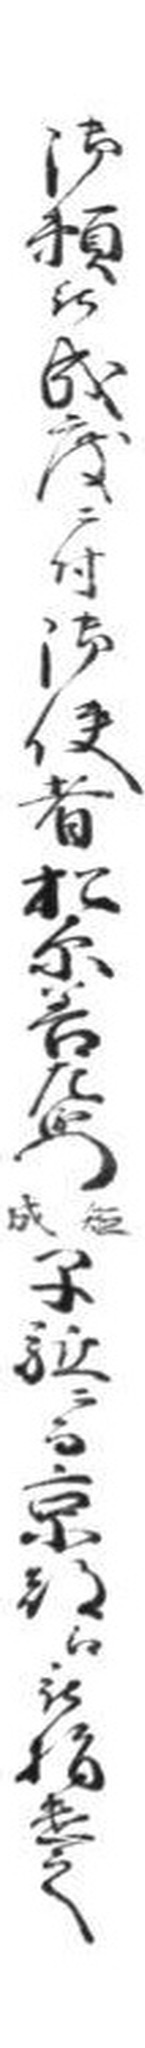御頼被成度ニ付御使者松原善左衛門矩成早駈ニ而京都江被指遣之
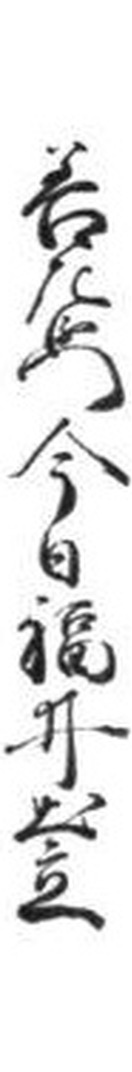善左衛門今日福井出立
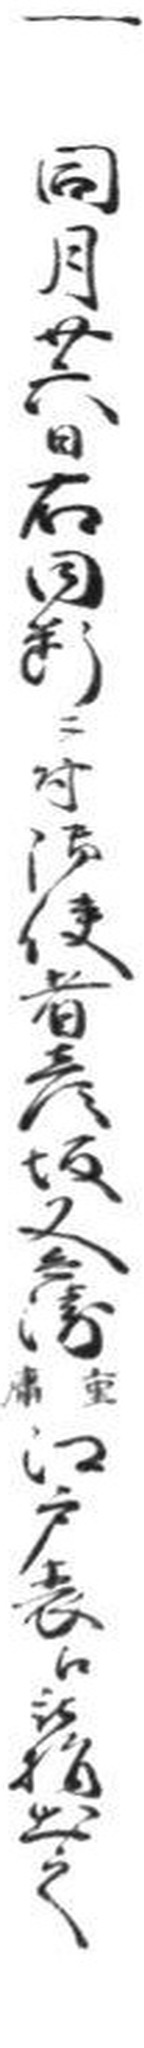一同月廿六日右同断ニ付御使者彦坂又兵衛重庸江戸表江被指出之
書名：家譜 十七 吉品公 従元禄元年到同二年
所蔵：福井県文書館 Fukui Prefectural Archives
